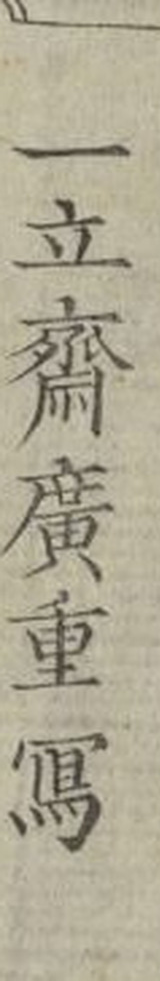一立斎広重寫
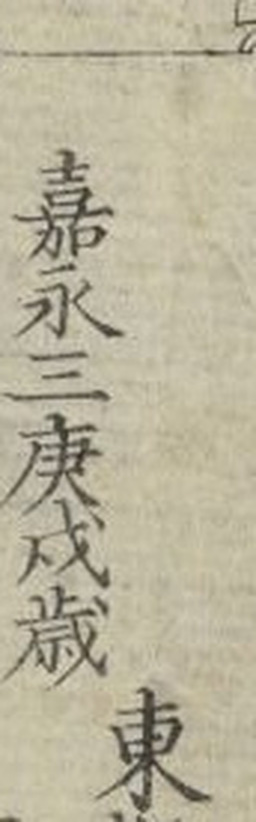嘉永三庚戌歳
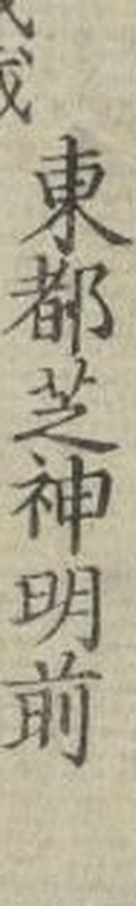東都芝神明前
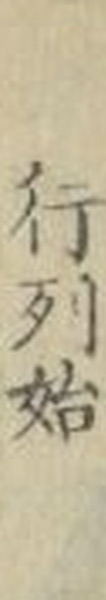行列始
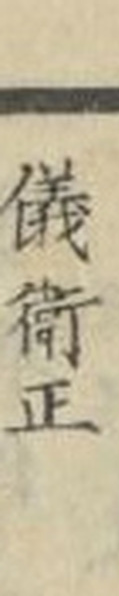儀衛正
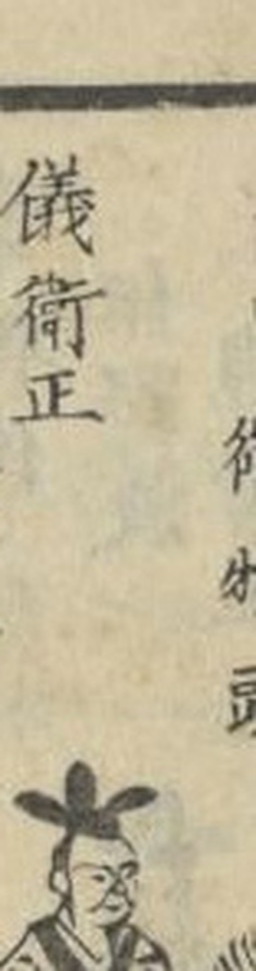儀衛正
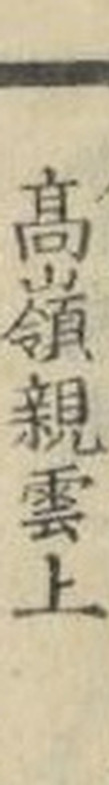高嶺親雲上

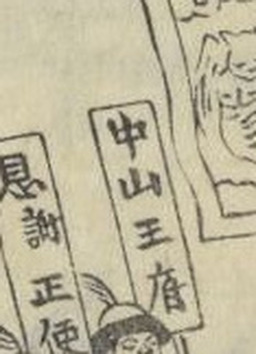中山王府
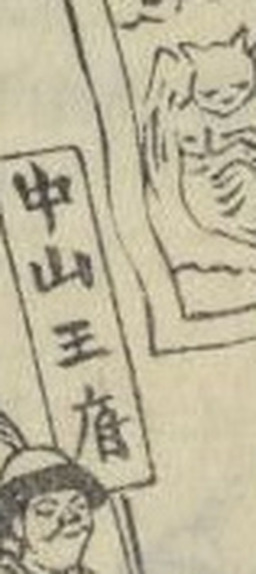中山王府
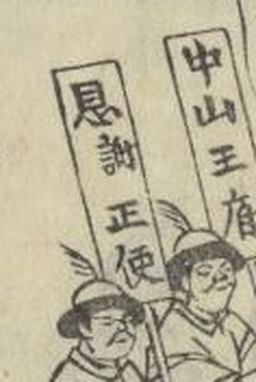恩謝正使
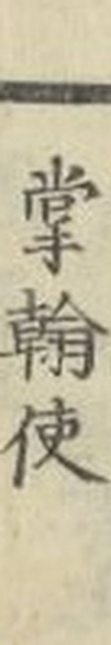掌翰使
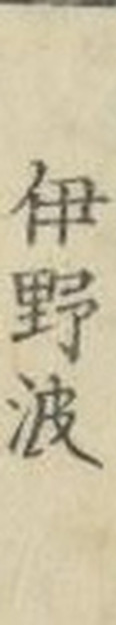伊野波
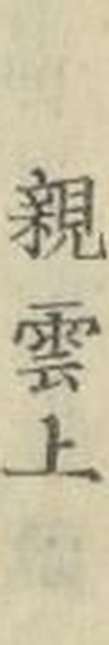親雲上
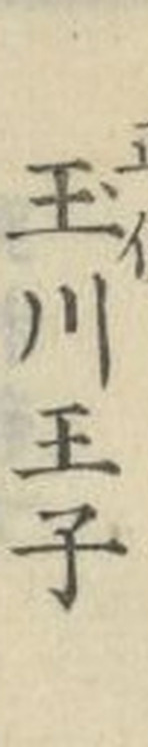玉川王子

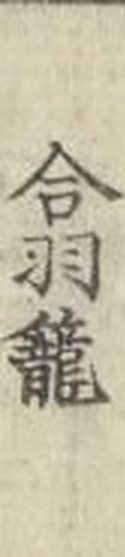合羽籠
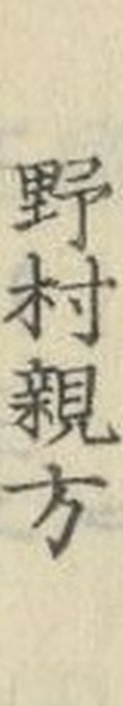野村親方
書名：琉球解語
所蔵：University of the Ryukyus Library
